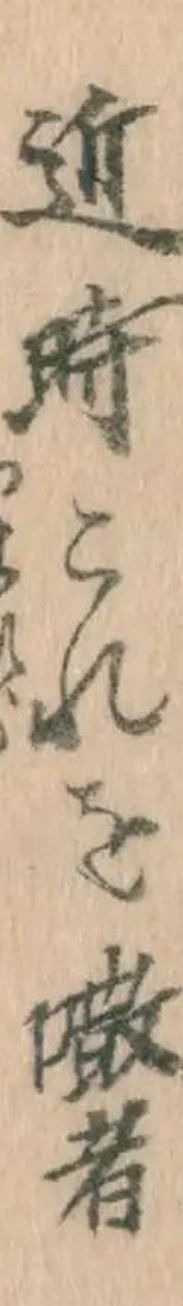近時これを噉者
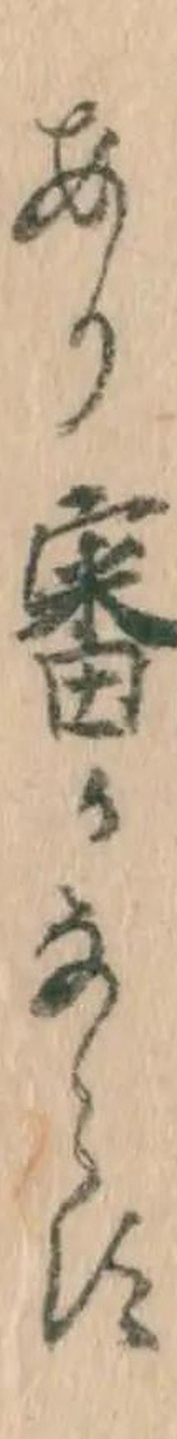あり審かならす
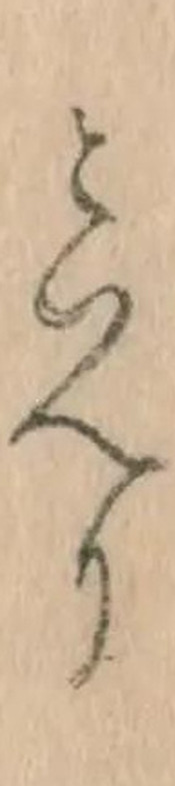といへり
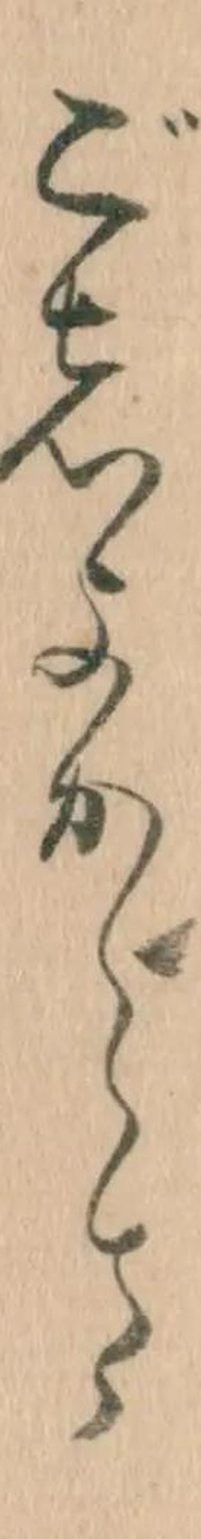ごしよからかさ
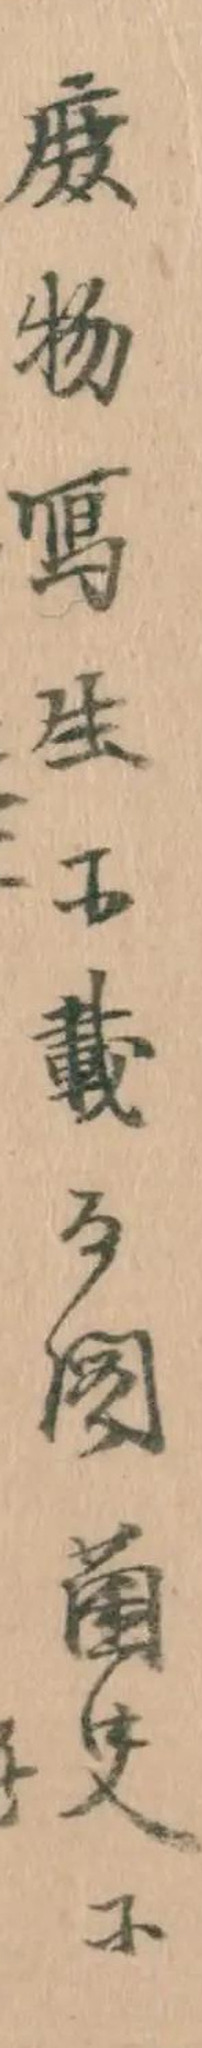庶物写生に載る図菌史に
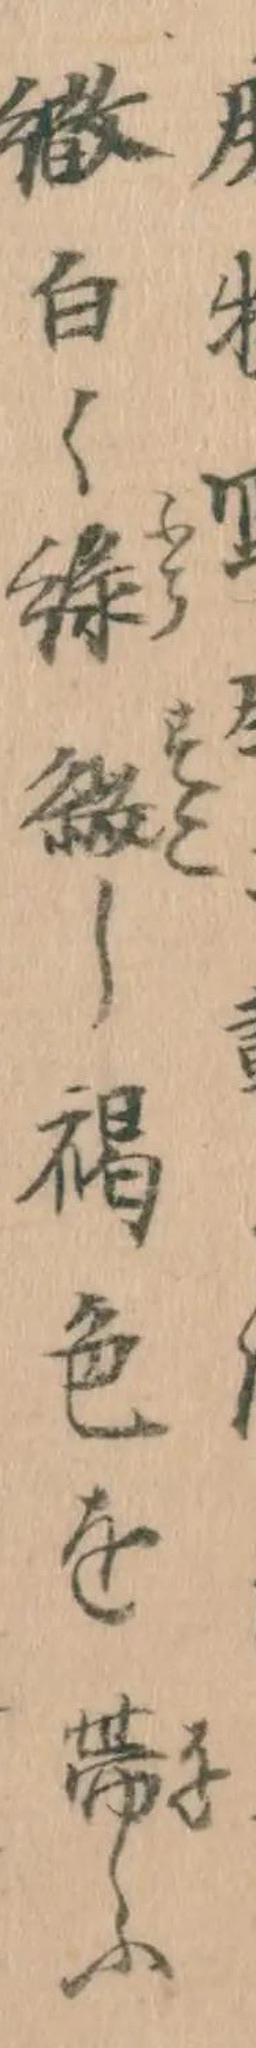繖白く緑微し褐色を帯ふ
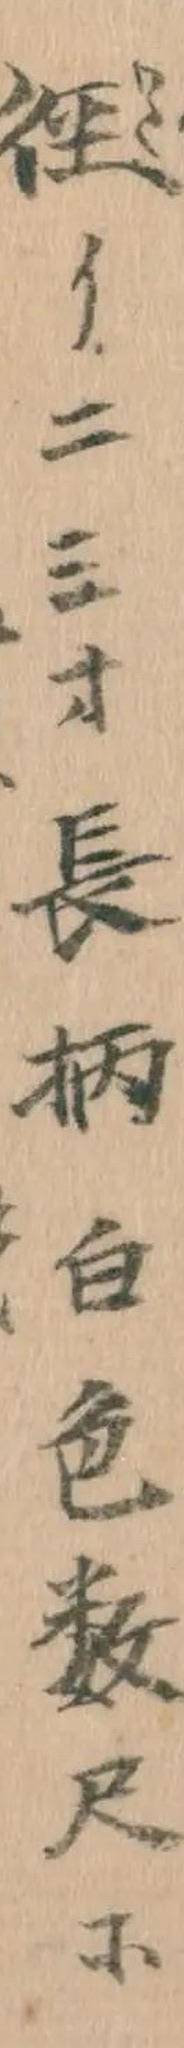径り二三寸長柄白色数尺に
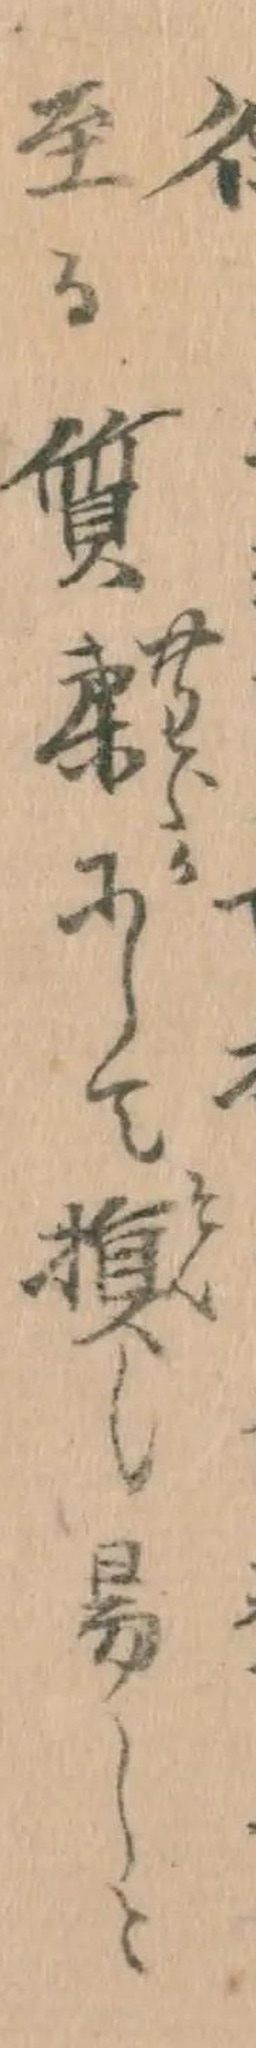至る質柔にして損し易しと
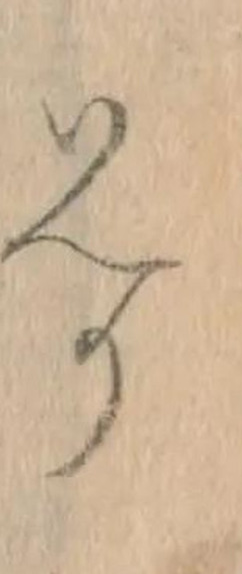いへり

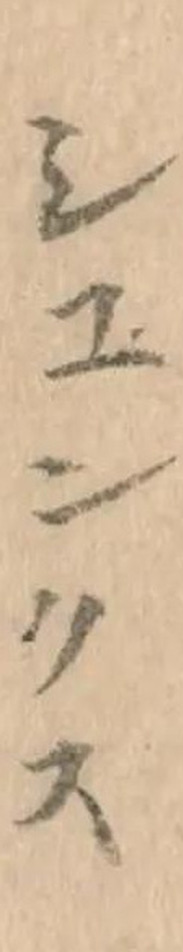シユンクス
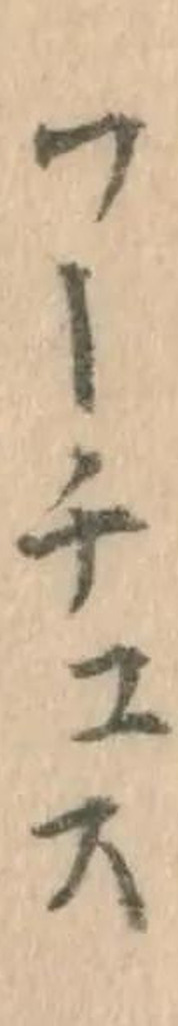フーチュス
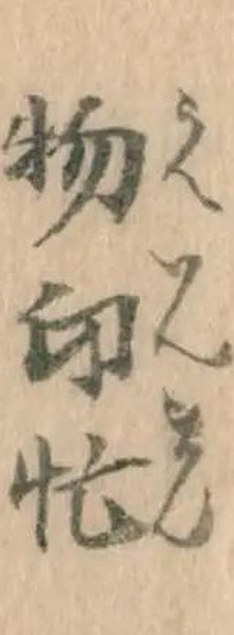物印忙
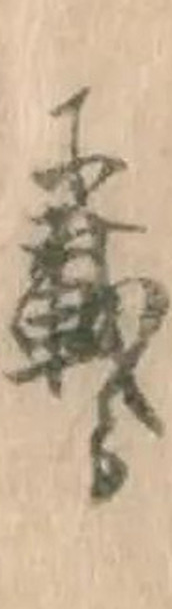に載る

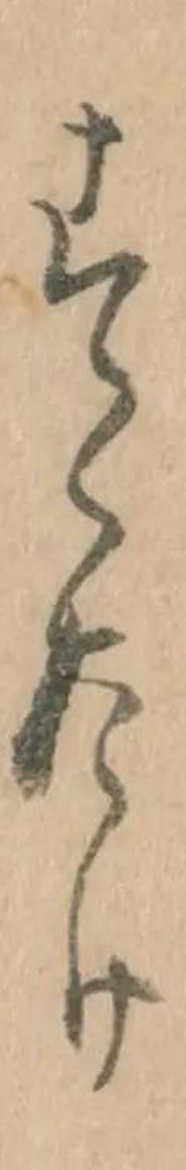すゝたけ
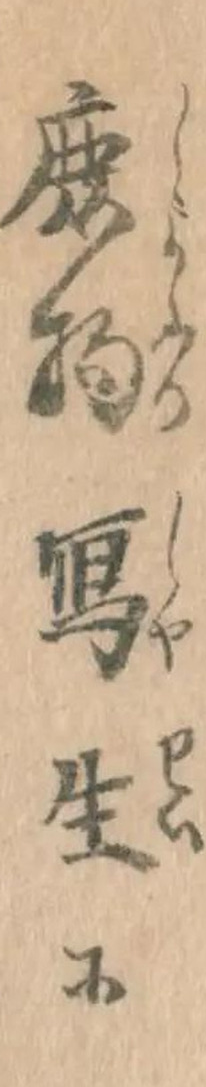庶物写生に
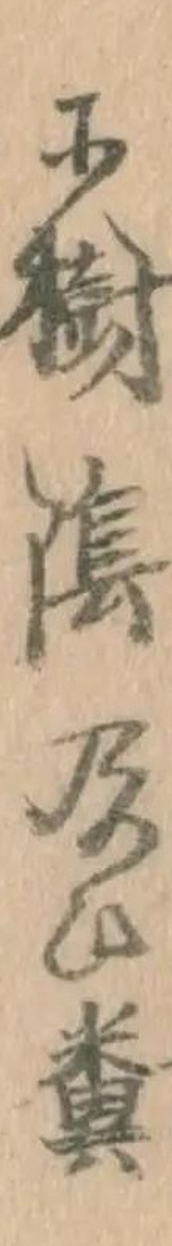に樹陰及ひ糞
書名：本草図譜. 巻58-60
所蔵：国立国会図書館 National Diet Library, JAPAN
